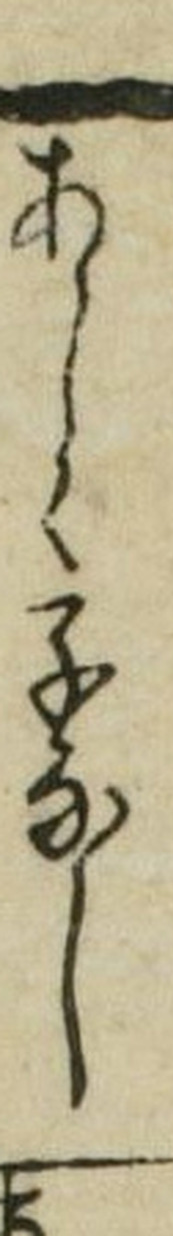あしく子なし
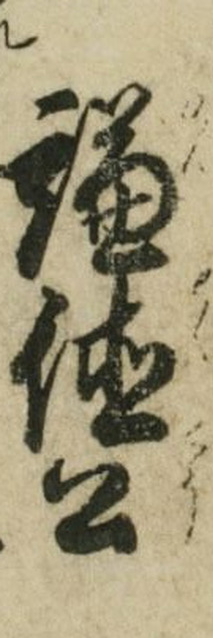謙徳公
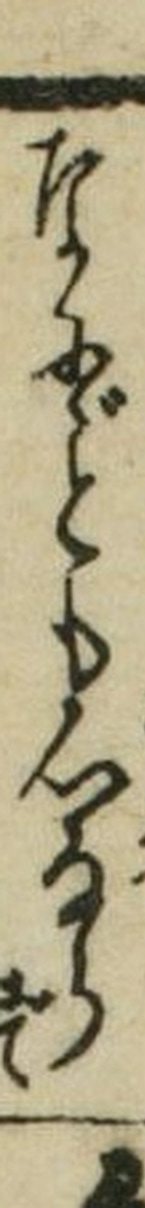なにごとも心ならず
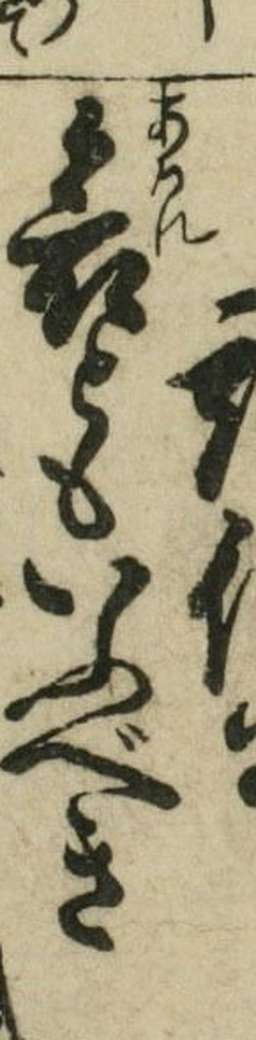哀ともいふべき
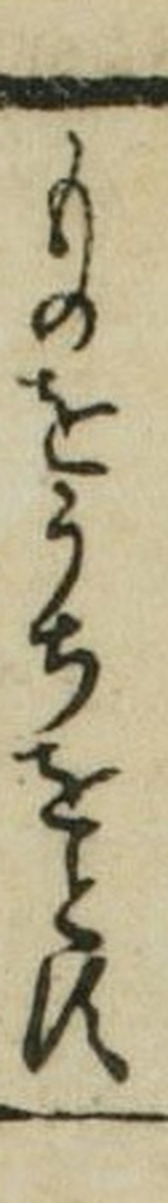ものをうちをとす
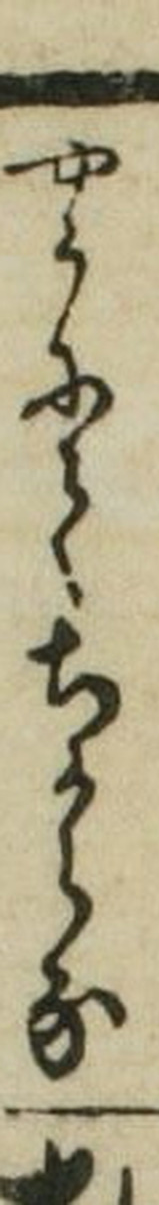やうにてちからな
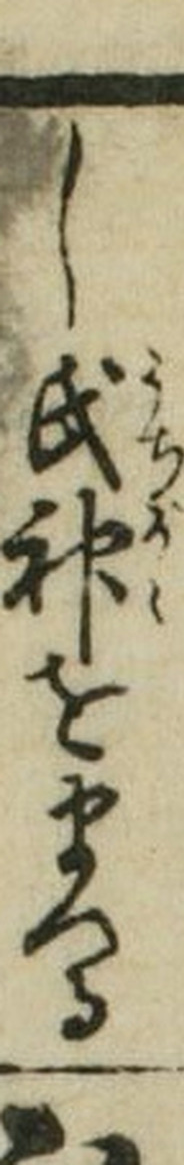し氏神をまつる
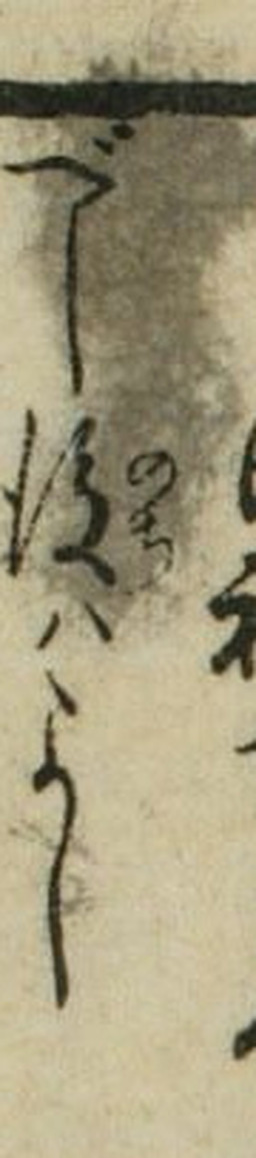べし後はよし
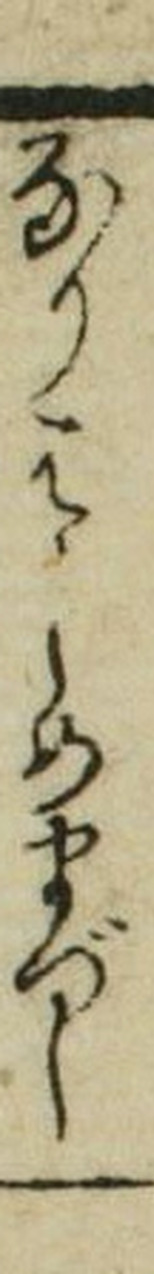なりはしめまづし
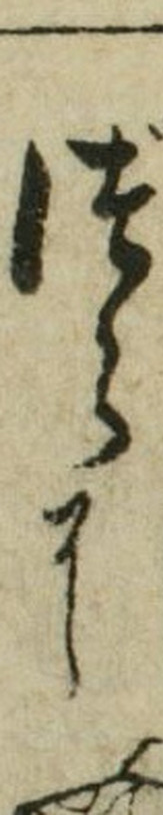づらに
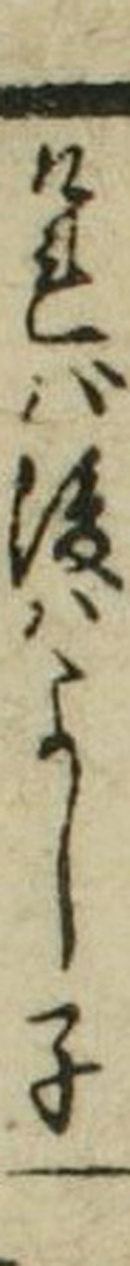ければ後はよし子
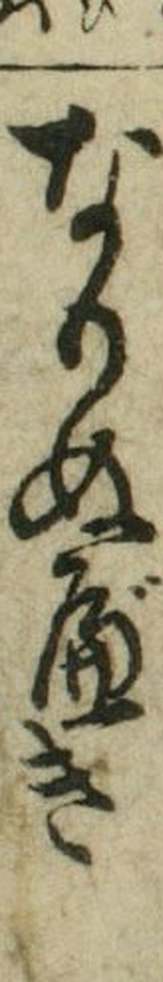なりぬべき
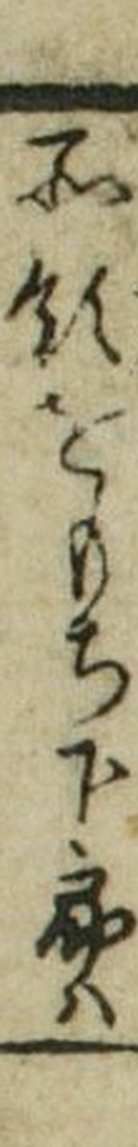所領をもち下郎は

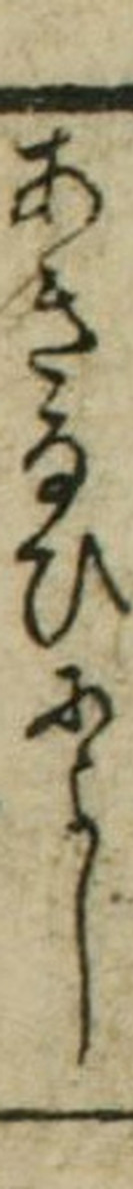あきなひによし
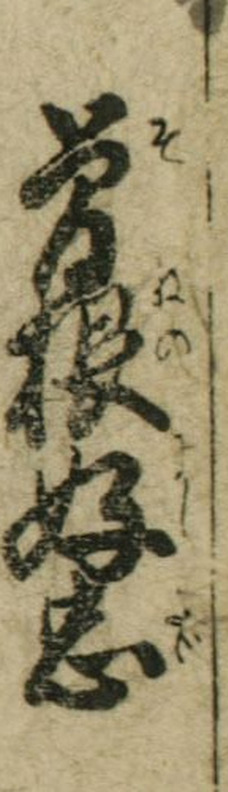曽根好忠
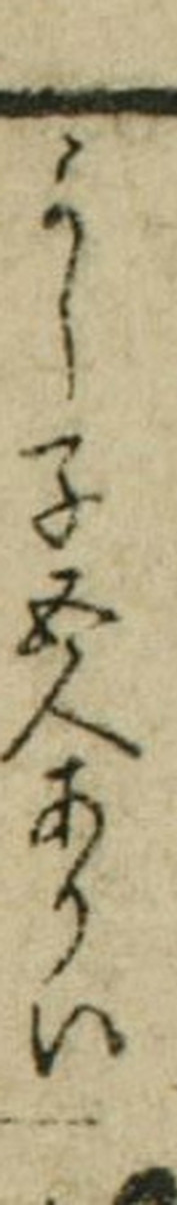よし子五人ありい
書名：百人一首
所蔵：東京学芸大学教育コンテンツアーカイブ
